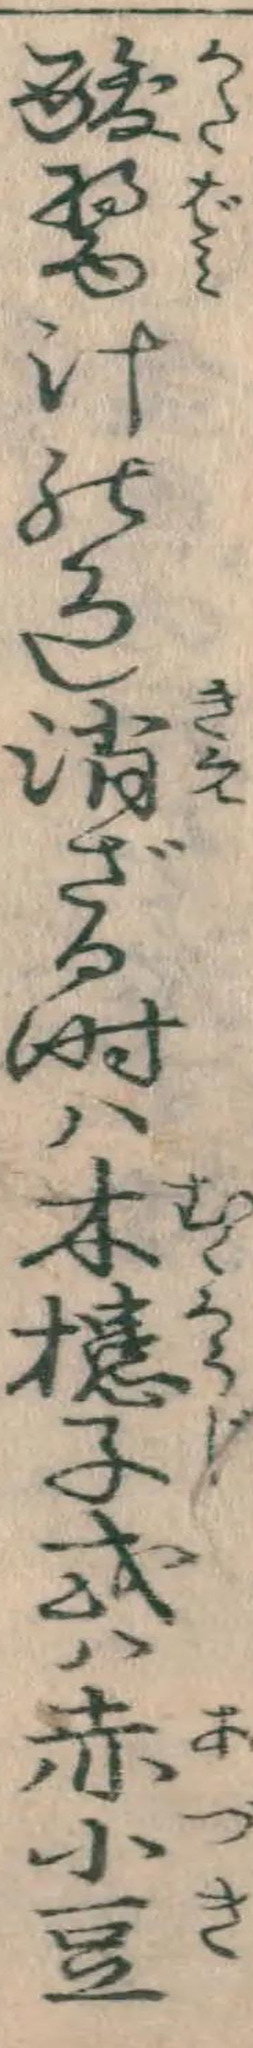酸醬汁の色消ざる時は木槵子或は赤小豆
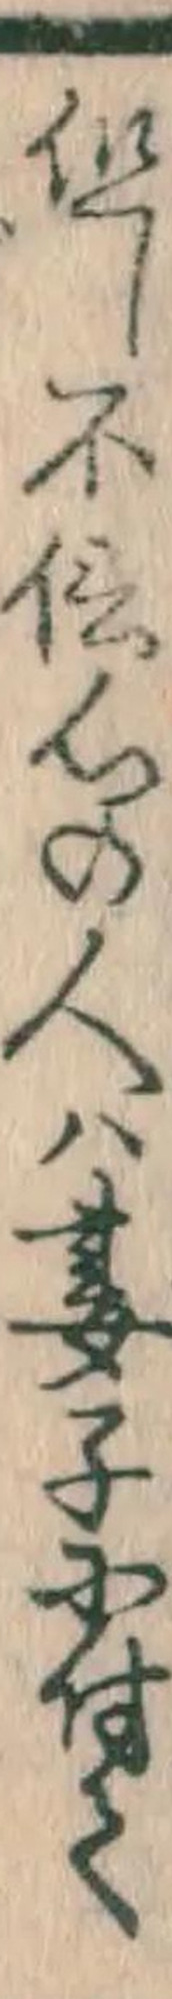但し不信心の人は妻子に付て
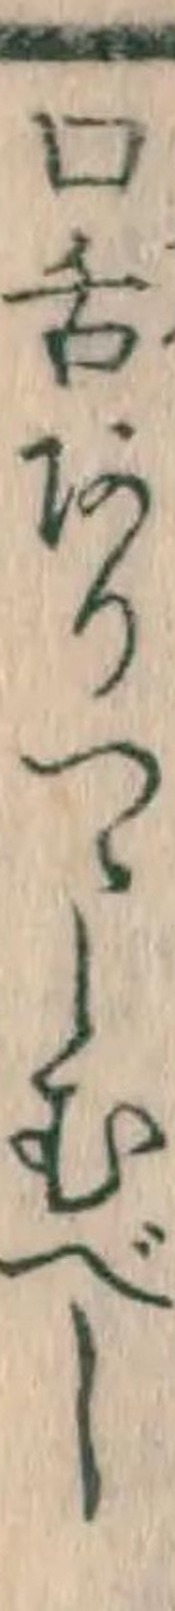口舌ありつゝしむべし
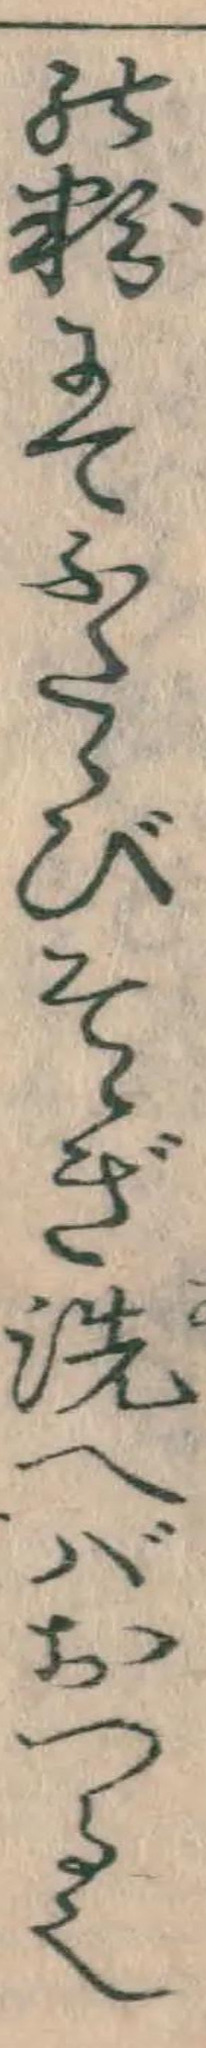の粉にてふたゝびそゝぎ洗へばおつる也
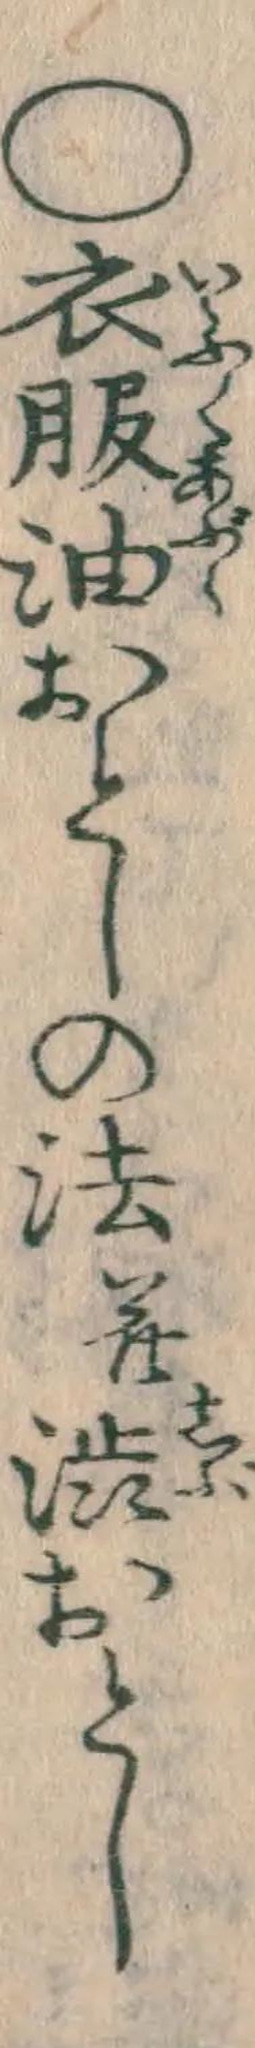○衣服油おとしの法并渋おとし
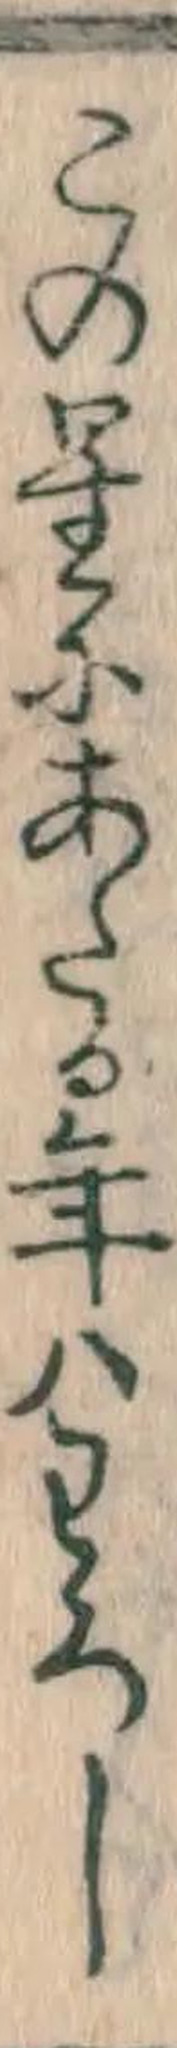この星にあたる年はわろし
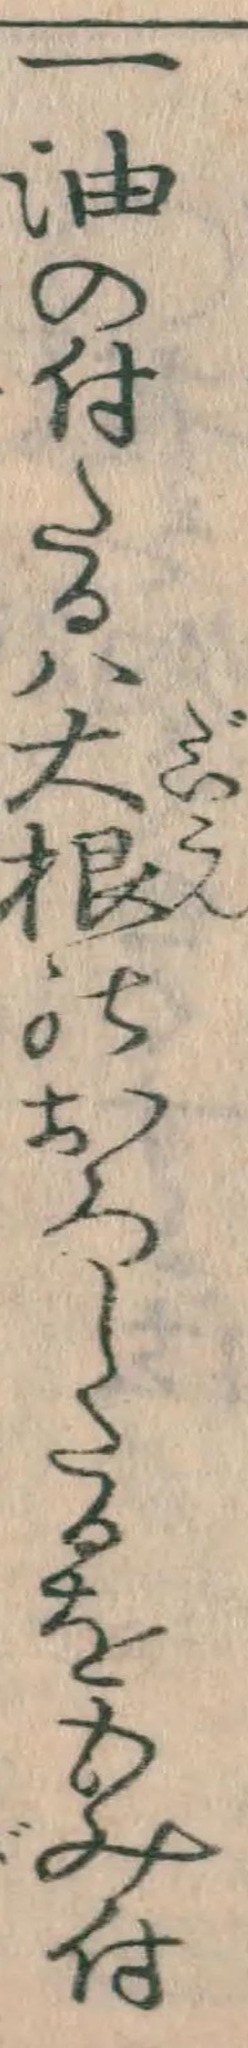一油の付たるは大根のおろしたるをもみ付
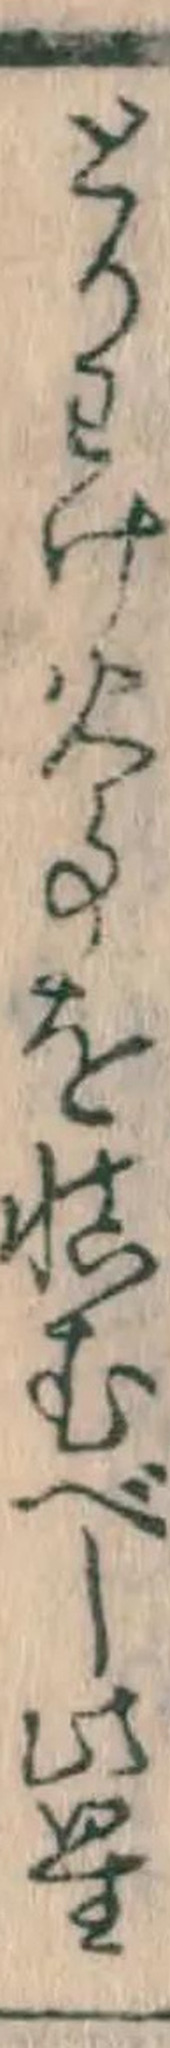とりわけ火事を慎むべし此星
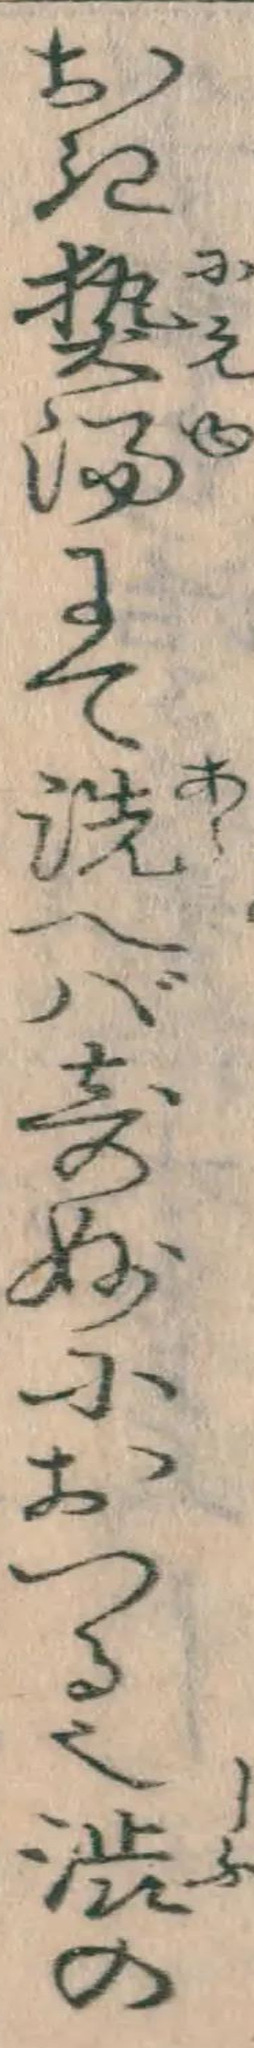おき熱湯にて洗へば奇妙におつる也渋の
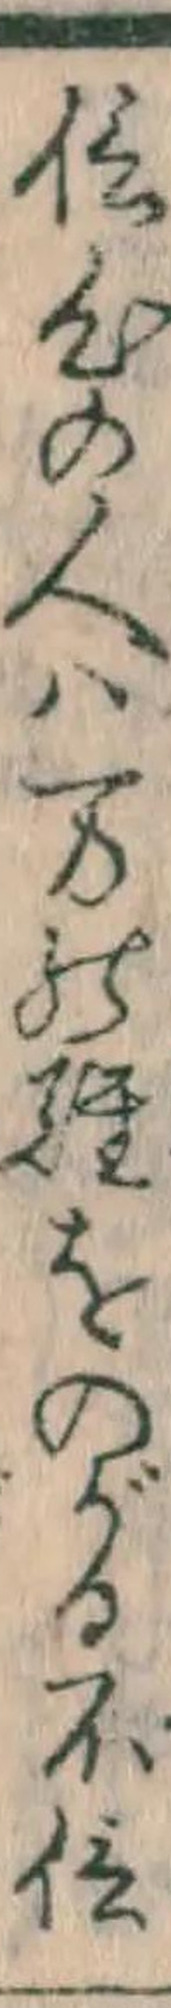信心の人は万の難をのがる不信
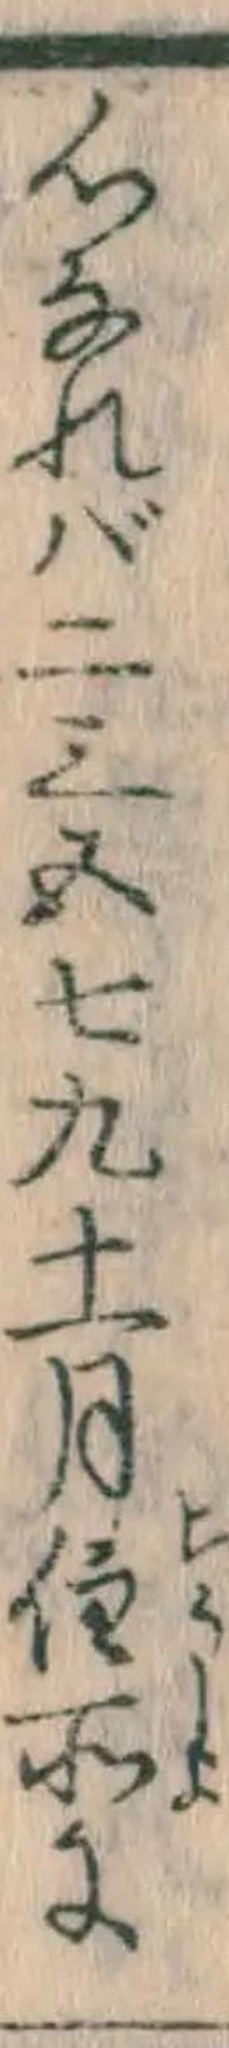心なれば二三五七九十一月住所に
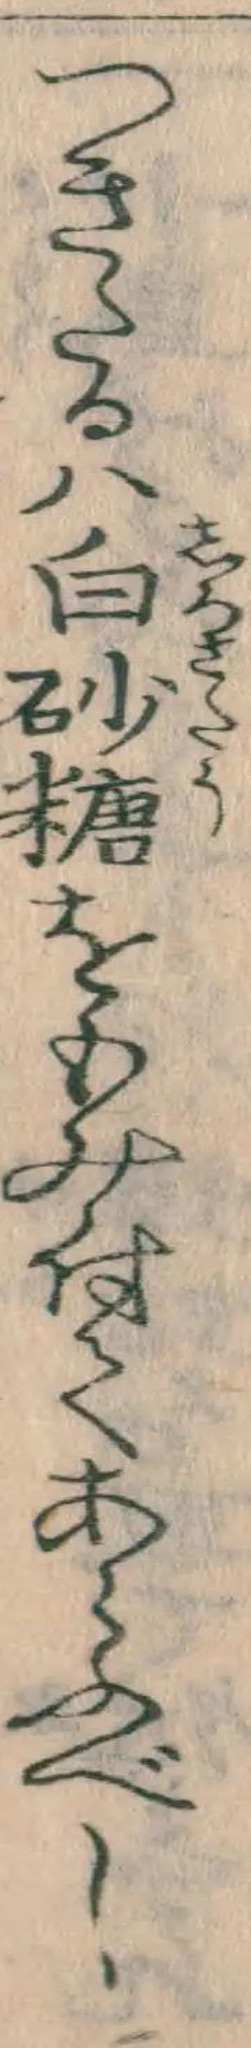つきたるは白砂糖をもみ付てあらふべし
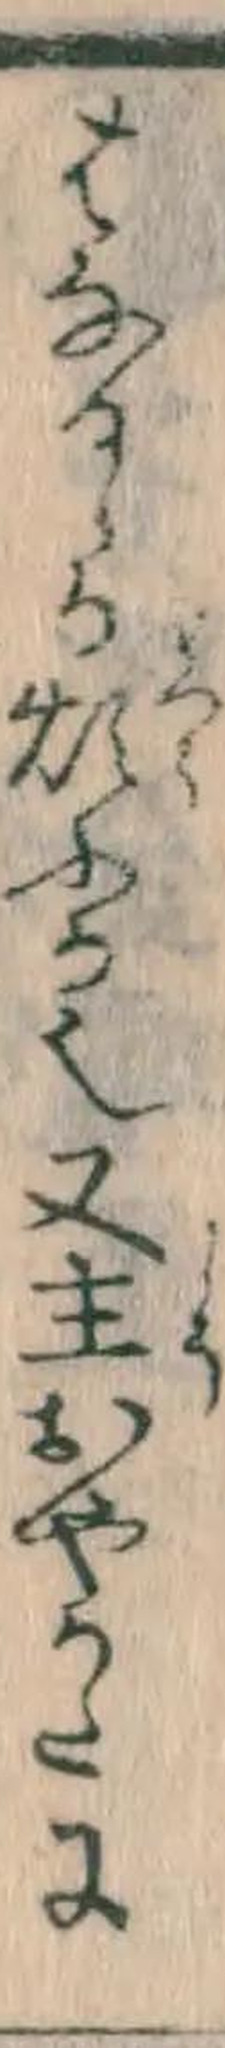はなるゝか煩ふか也又主おやかたに
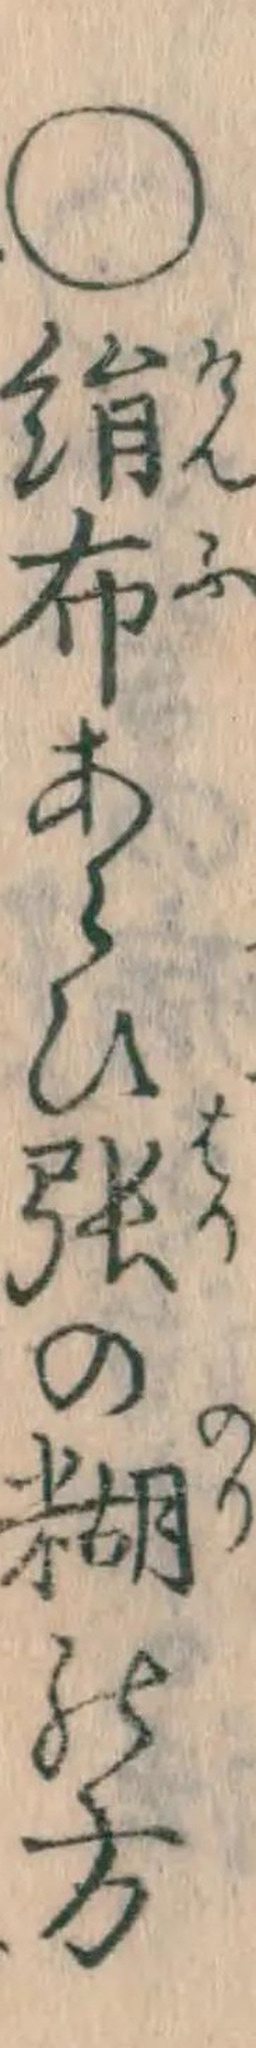○絹布あらひ張の糊の方
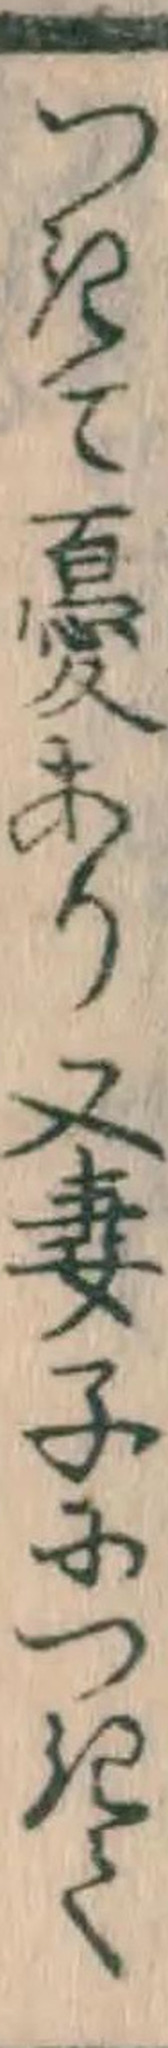つきて憂あり又妻子につきて
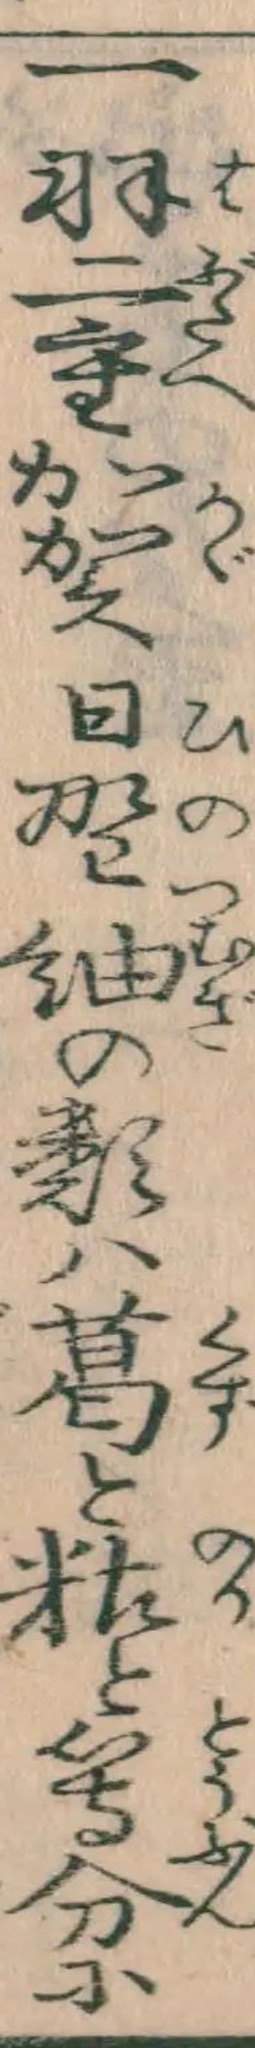一羽二重加賀日野紬の類は葛と粘と等分に
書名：広益秘事大全 3巻. [1]
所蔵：国立国会図書館 National Diet Library, JAPAN
